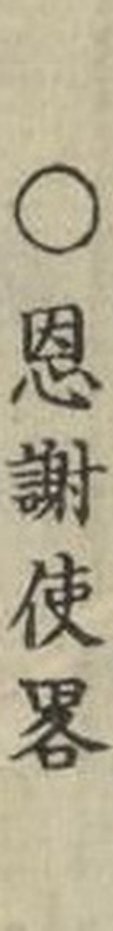○恩謝使略
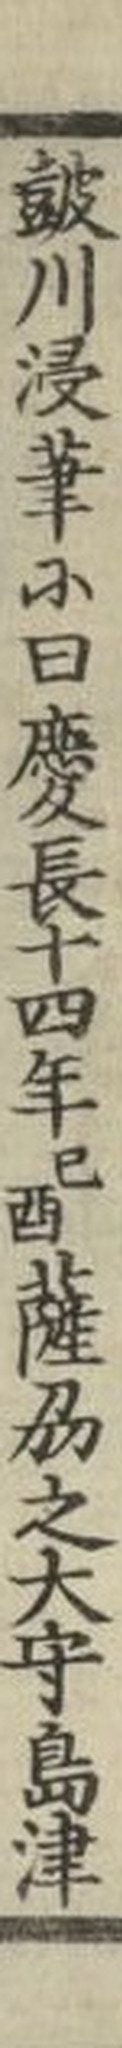皷川浸筆に曰慶長十四年己酉薩州之大守島津
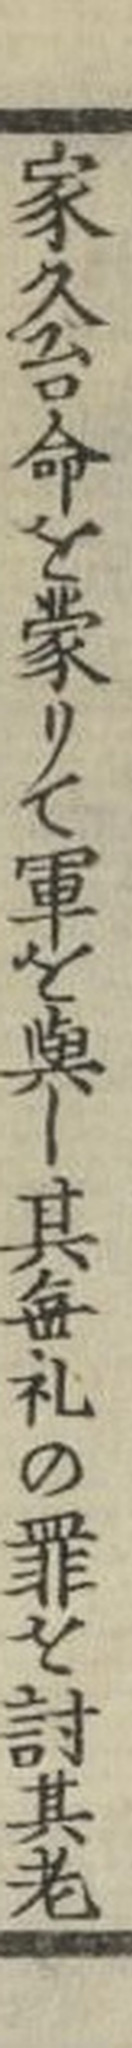家久台命を蒙りて軍を与し其無礼の罪を討其老
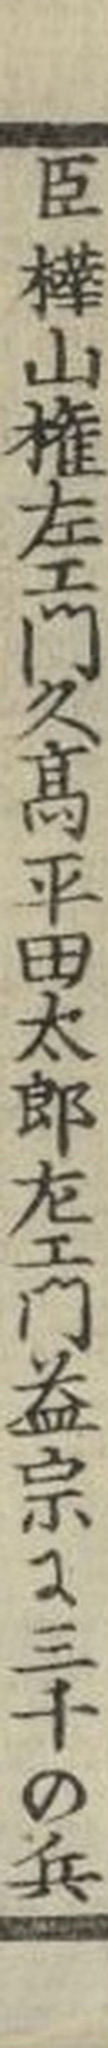臣樺山権左エ門久高平田太郎左エ門益宗に三千の兵
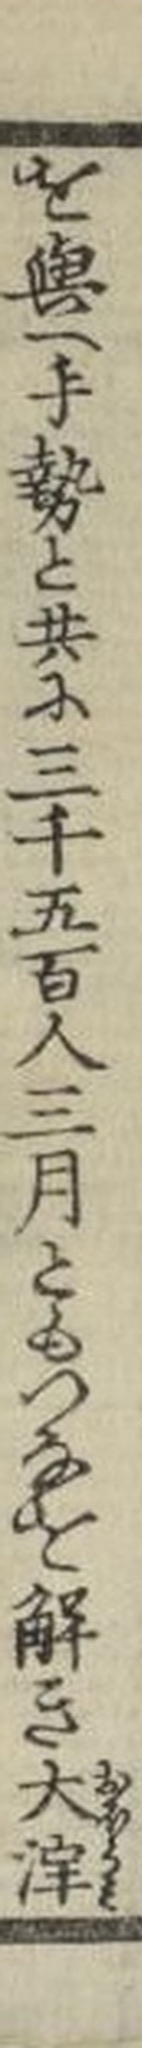を与へ手勢と共に三千五百人三月ともつなを解き大洋
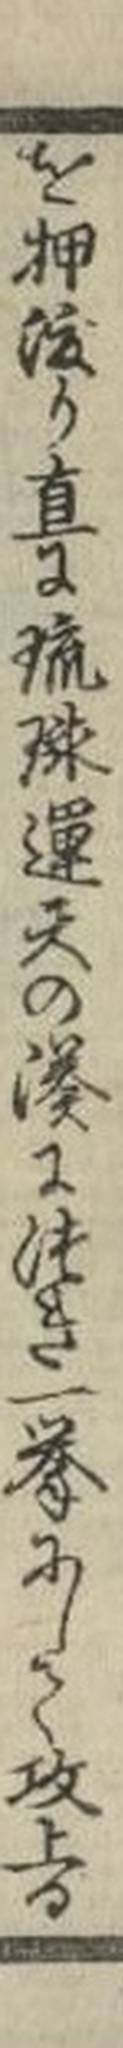を押渡り直に琉球運天の湊につき一挙にして攻上る
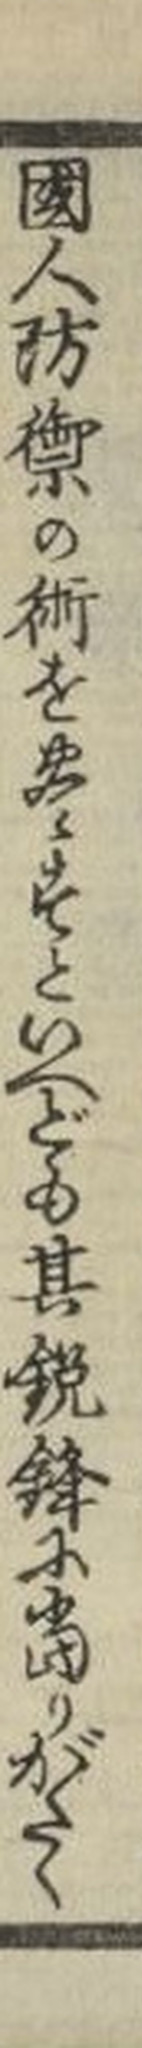国人防禦の術を廻らすといへども其鋭鋒に当りがたく
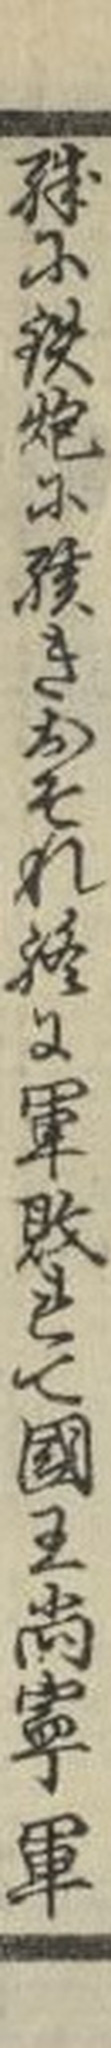殊に鉄炮に駭きおそれ終に軍敗れて国王尚寧軍
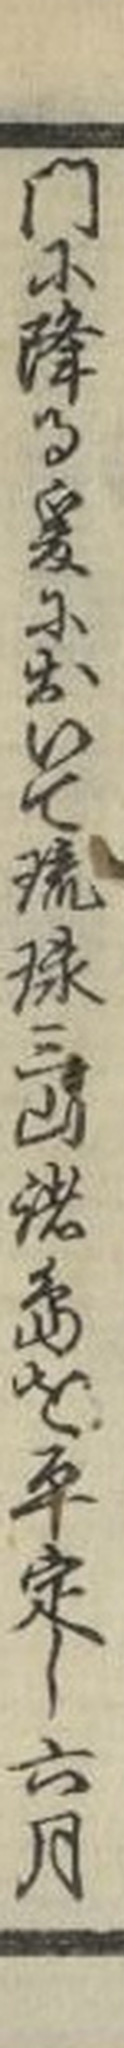門に降る爰において琉球三山諸島を平定し六月
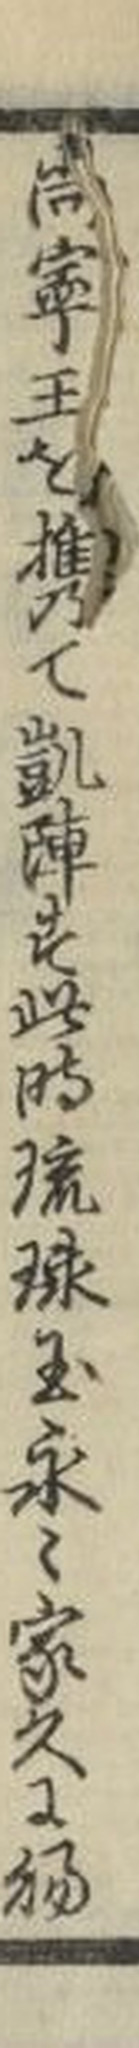尚寧王を携て凱陣す此時琉球玉永々家久に揚
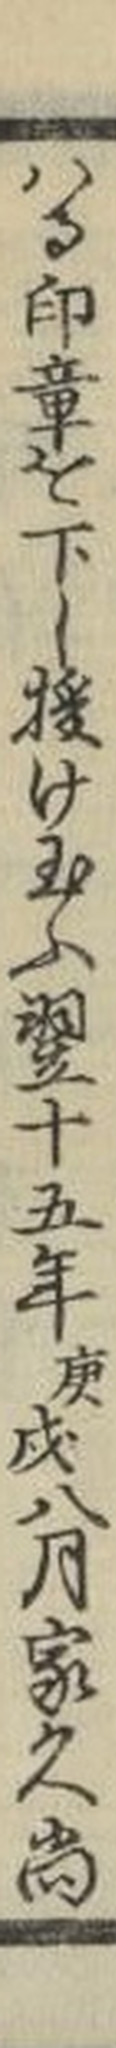はる印章を下し援け玉ふ翌十五年庚戌八月家久尚
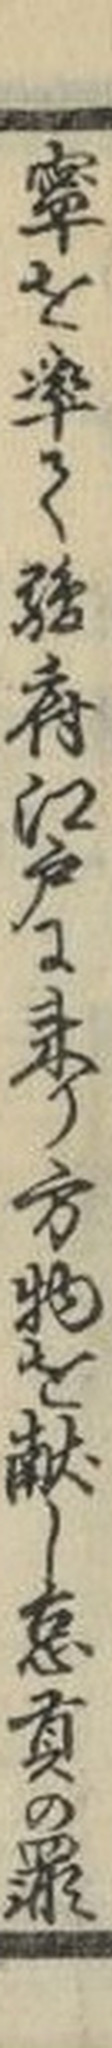寧を率て駿府江戸に来り方物を献し怠貢の罪
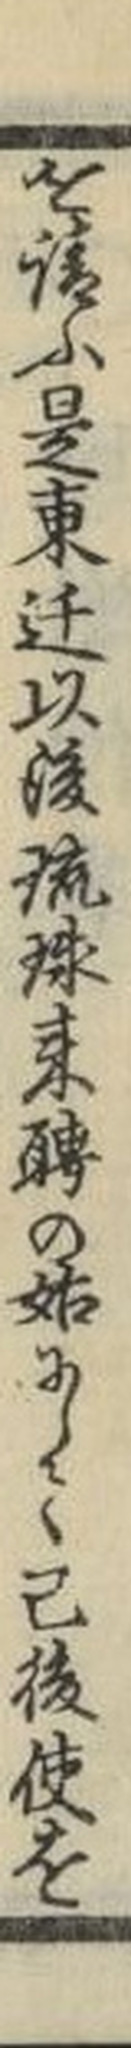を請ふ是東迁以後琉球来聘の始にして已後使を
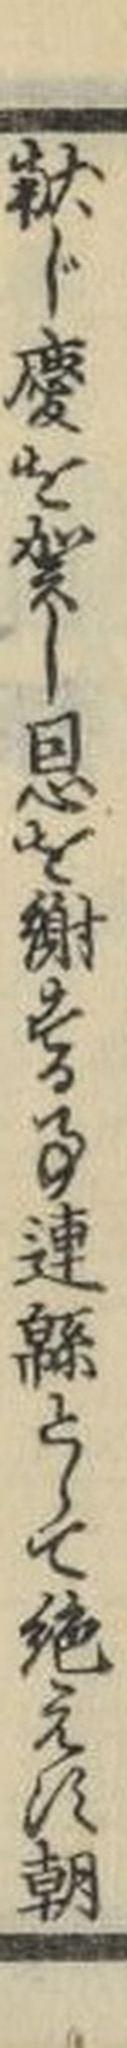献じ慶を賀し恩を謝する事連緜として絶えす朝
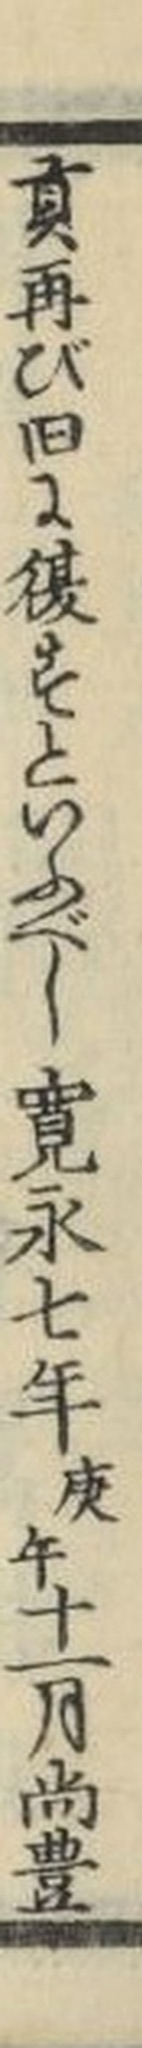貢再び旧に復すといふべし寛永七年庚午十一月尚豊
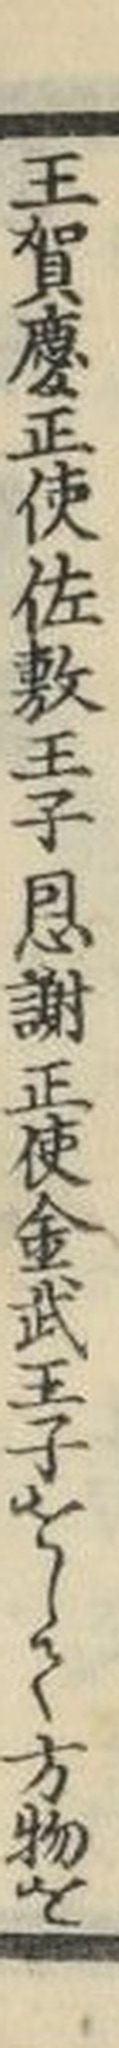王賀慶正使佐敷王子恩謝正使金武王子をして方物を
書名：琉球解語
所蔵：University of the Ryukyus Library
